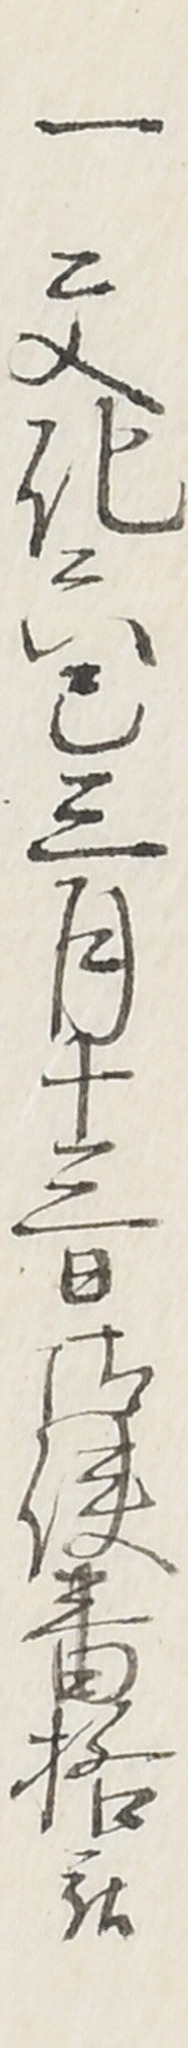一文化六巳三月十三日御使番格被
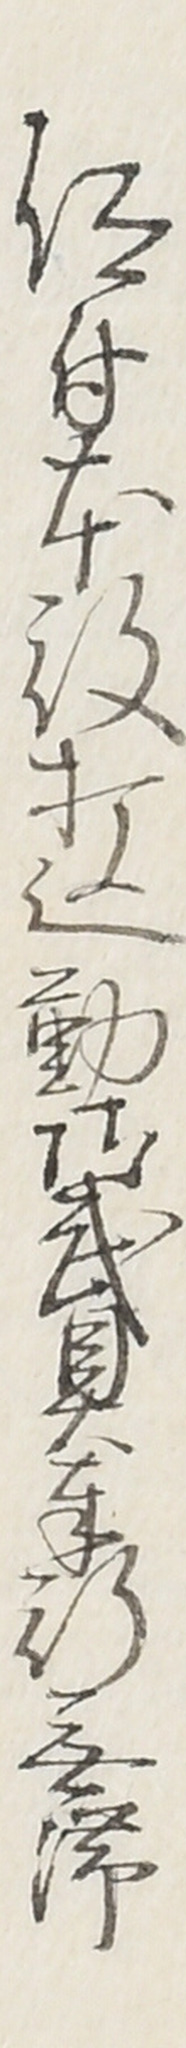仰付本役打込勤御武具奉行無滞
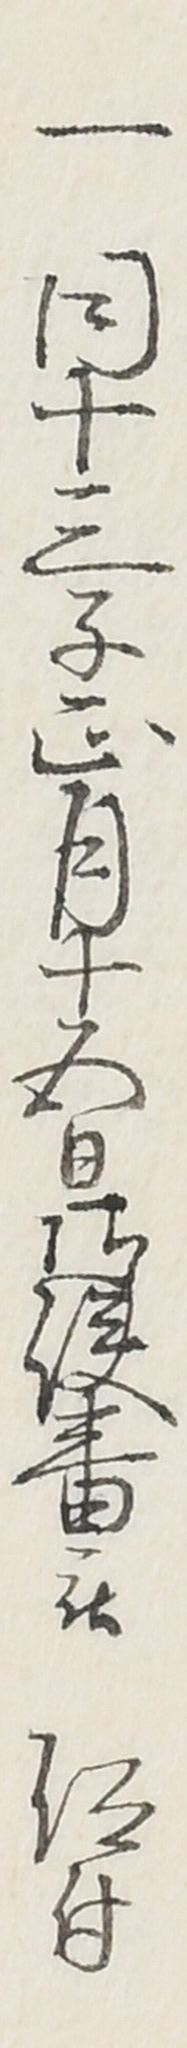一同十三子正月十五日御使番被仰付
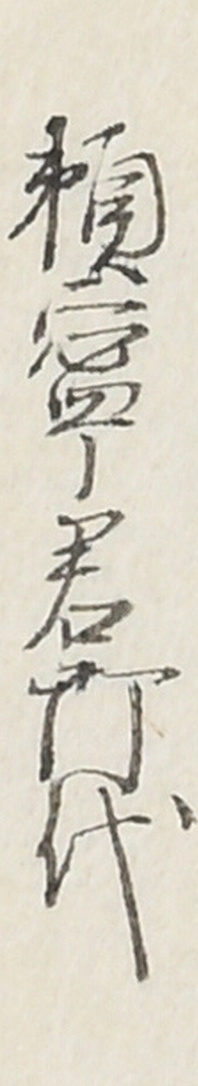頼寧君御代
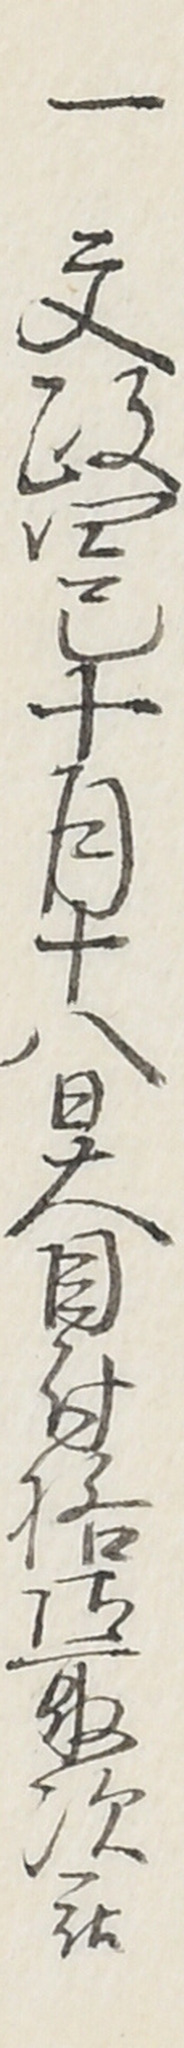一文政巳十月十八日大目付格御取次被
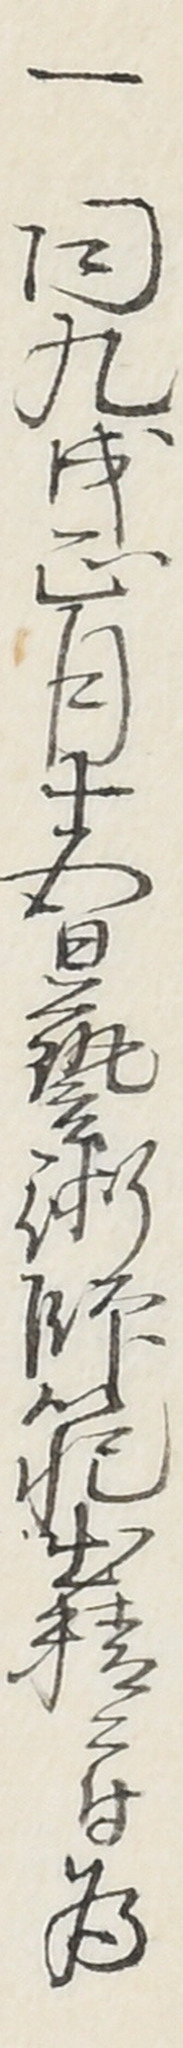一同九戌正月十五日芸術師範出精ニ付為
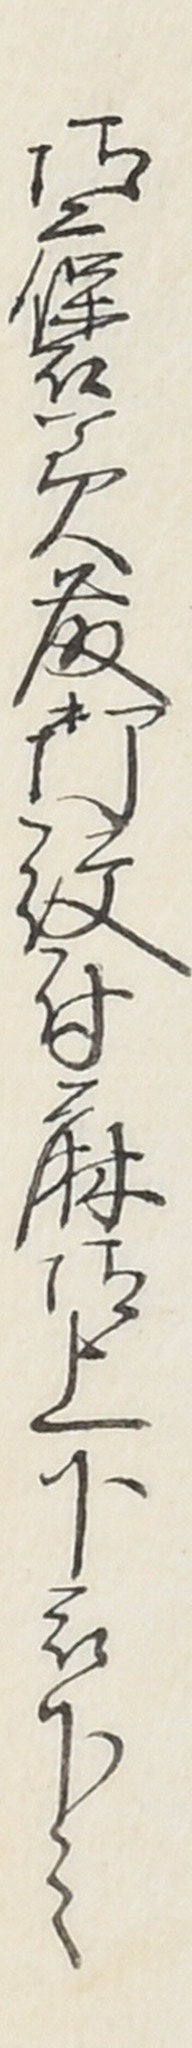御褒美藤御紋付麻御上下被下之

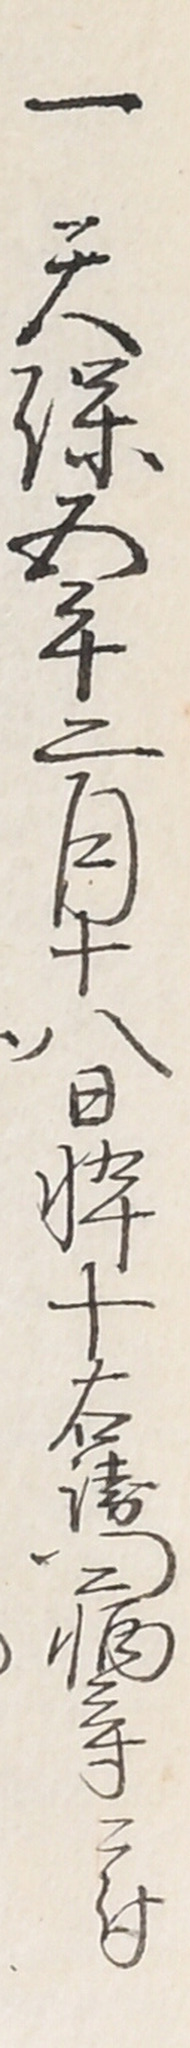一天保五午二月十八日伜十右衛門病気ニ付
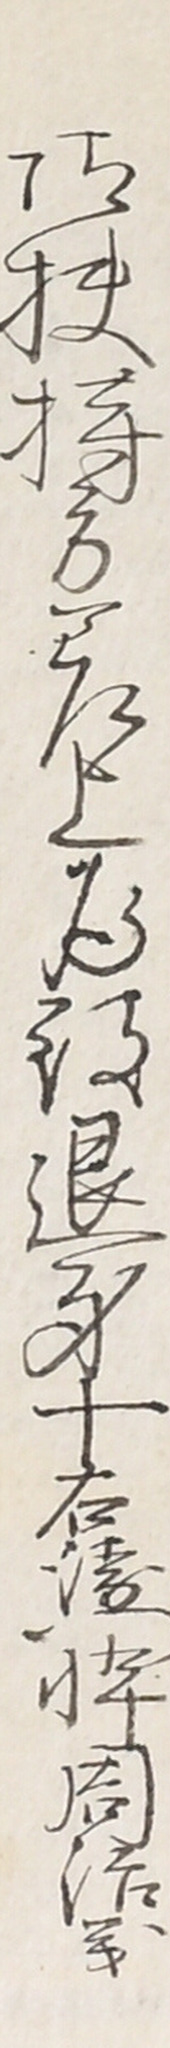御扶持方差上為致退身十右衛門伜周治義
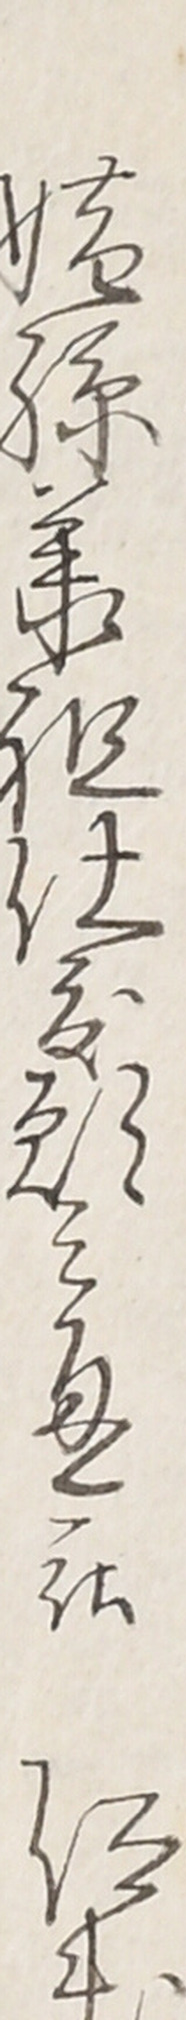嫡孫承祖仕度願之通被仰出
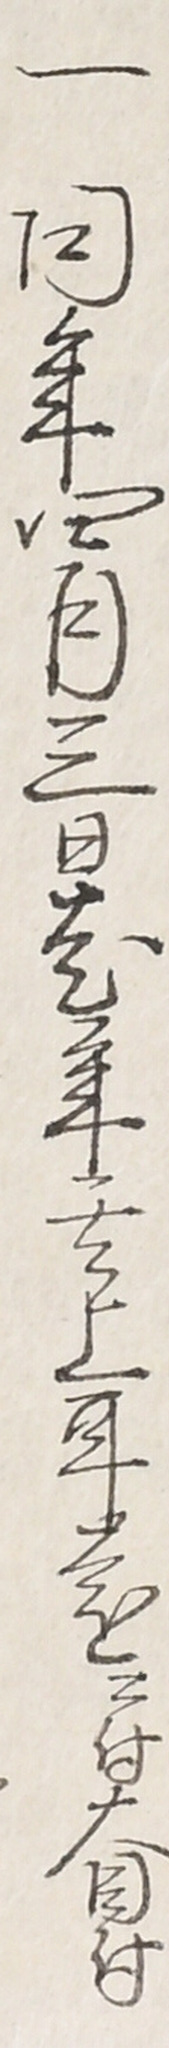一同年四月三日老年其上耳遠ニ付大目付
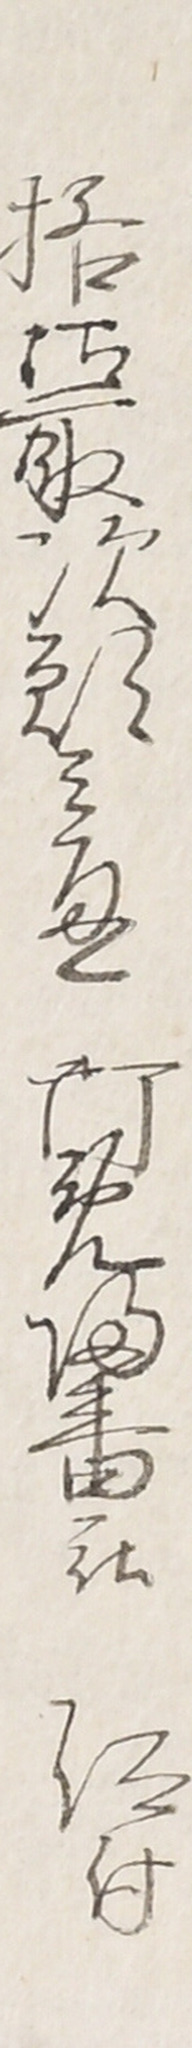格御取次願之通御免帰番被仰付
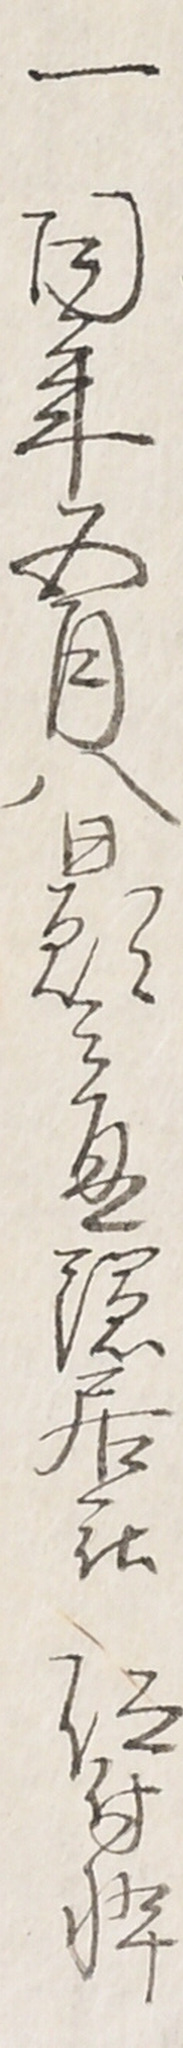一同年五月八日願之通隠居被仰付伜
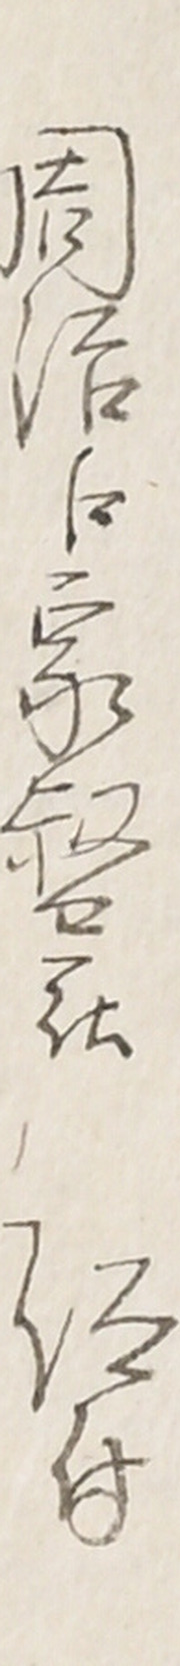周治江家督被仰付
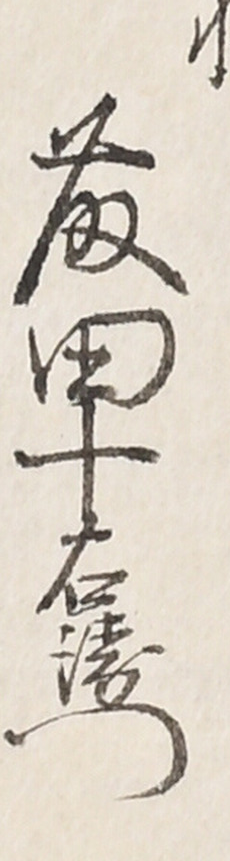藤田十右衛門
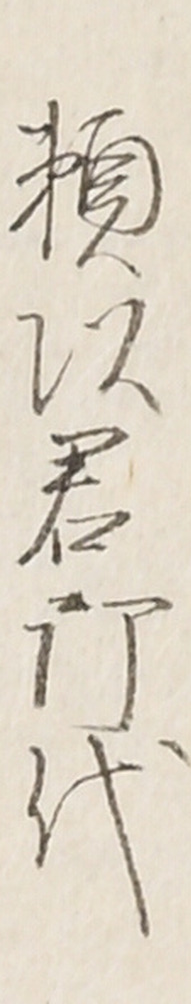頼以君御代
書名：給人諸士勤仕録（七）
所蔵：伊那市立高遠町図書館・合同会社AMANE
